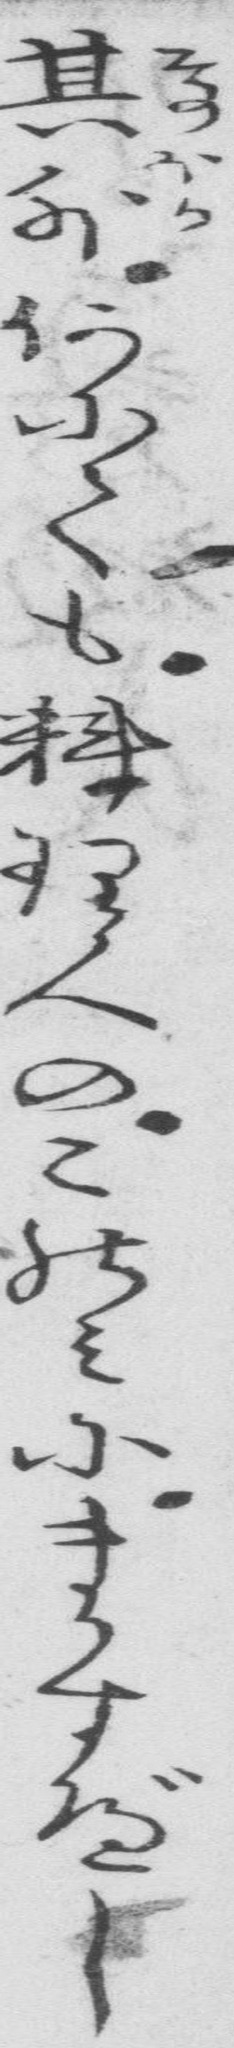其外。何にても。料理人の。このみに。まかすべし
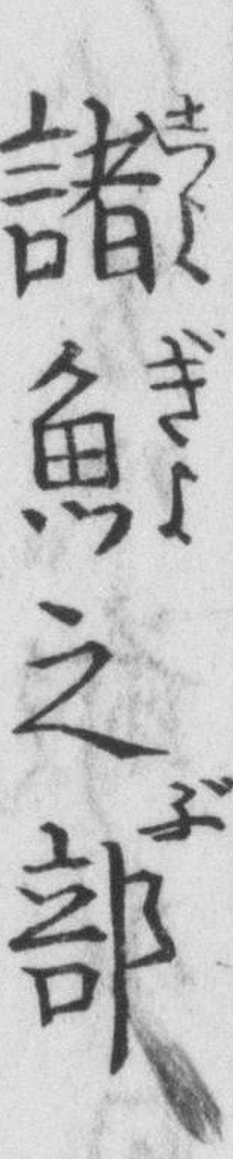諸魚の部
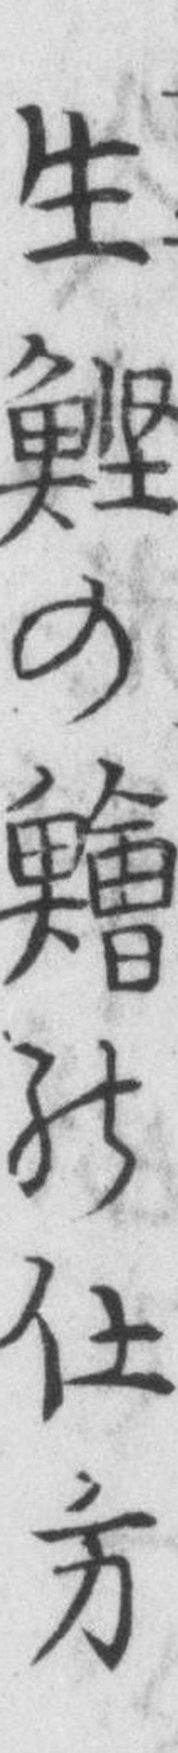生鰹の鱠の仕方
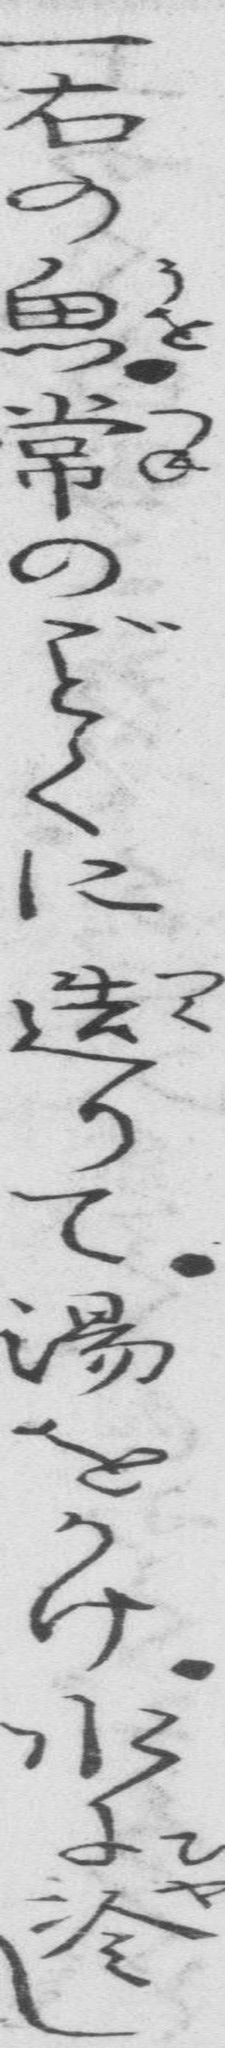一右の魚。常のごとくに造りて。湯をかけ。水に冷し
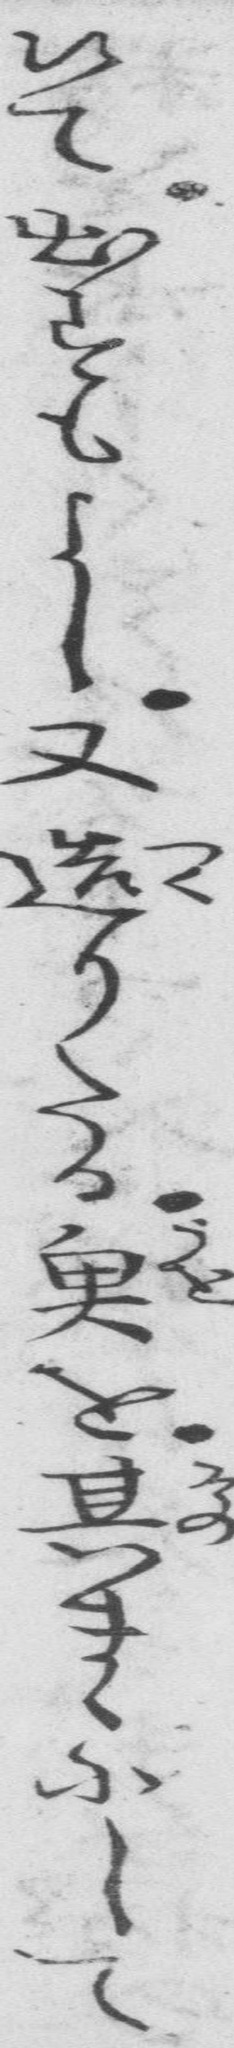候て。出すもよし。又造りたる。魚を。其まゝにして
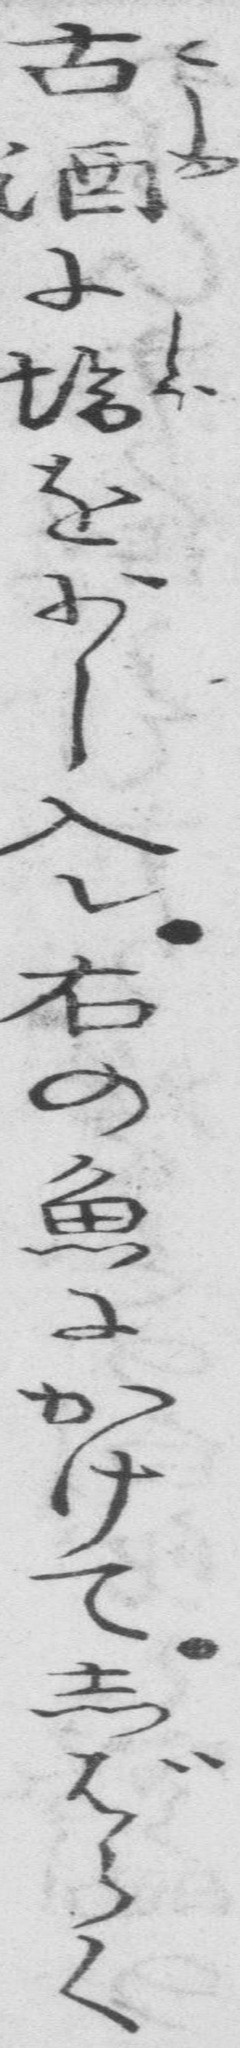古酒に塩を少し入れ。右の魚にかけて。しばらく
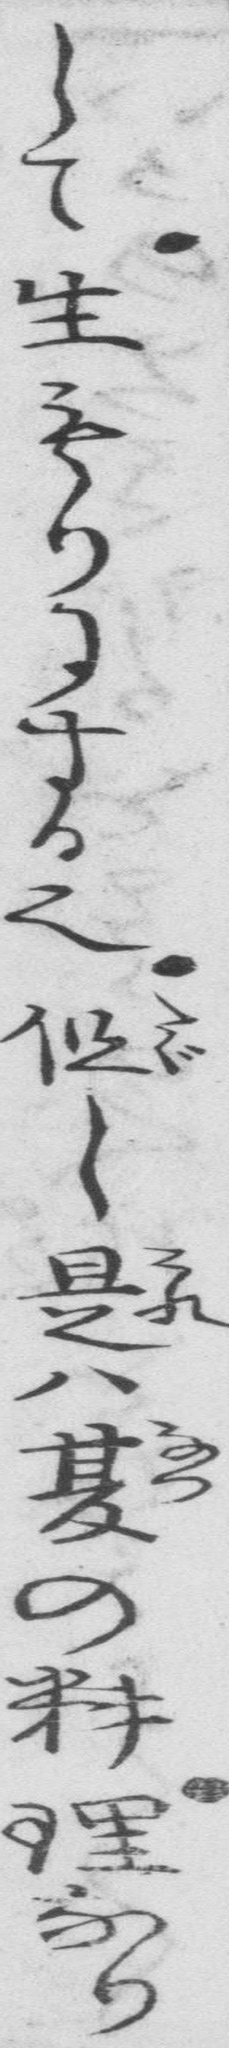して。生もりにする也。但し是は夏の料理なり
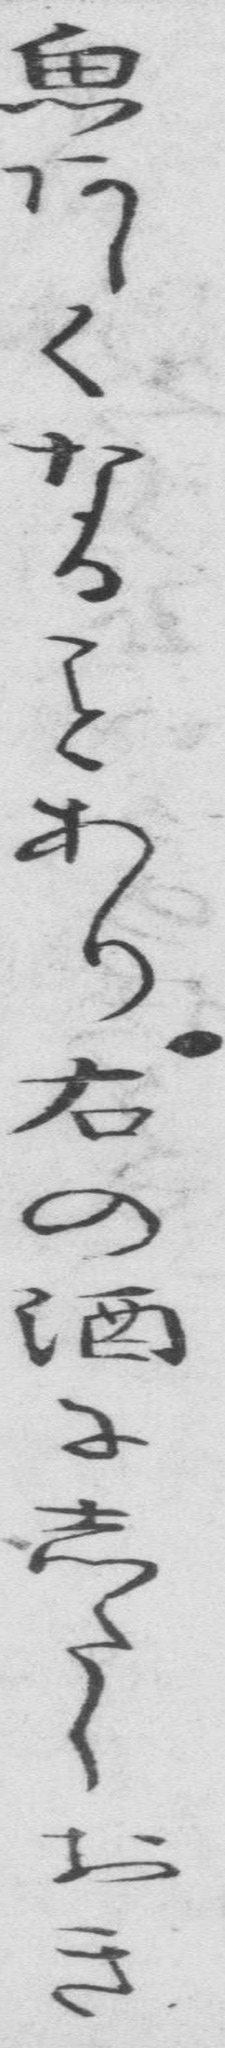魚あしくなることあり。右の酒にしたしおき
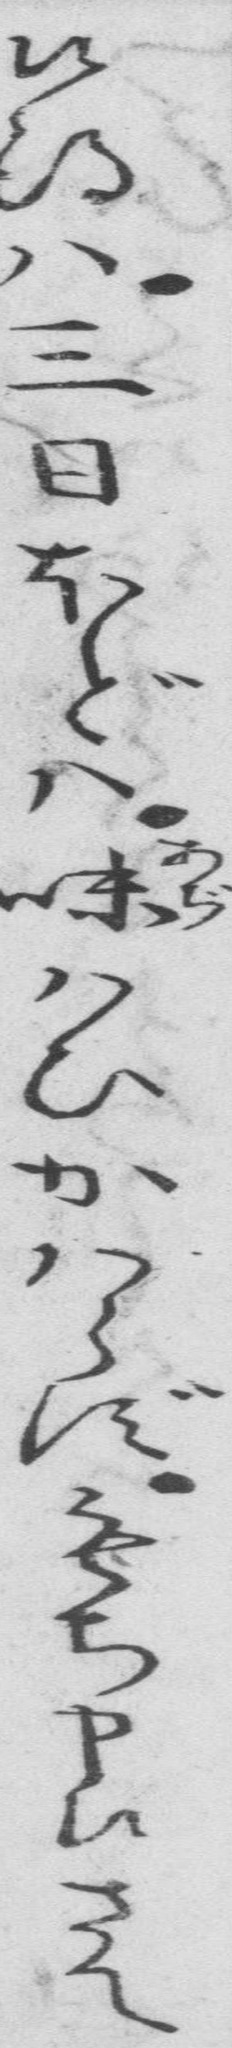候得は。三日ほどは。味はひかはらず。もち申候さて

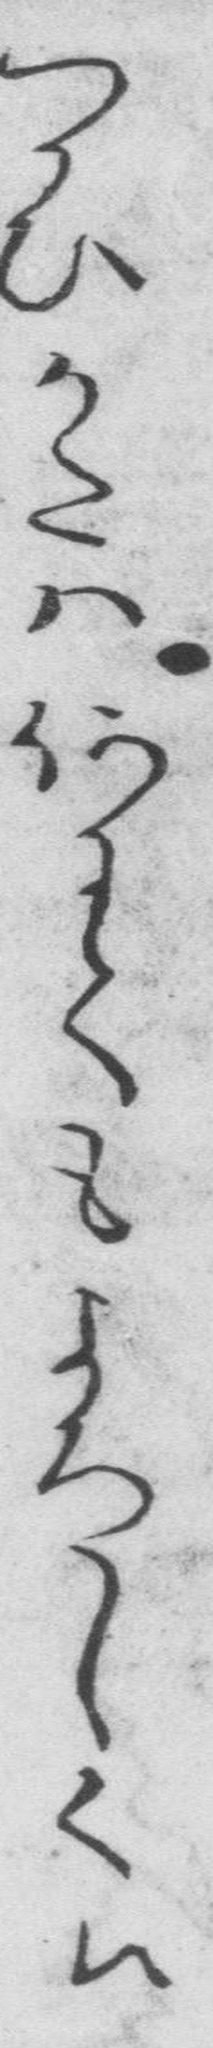つかひかたは。何にてもよろしく候
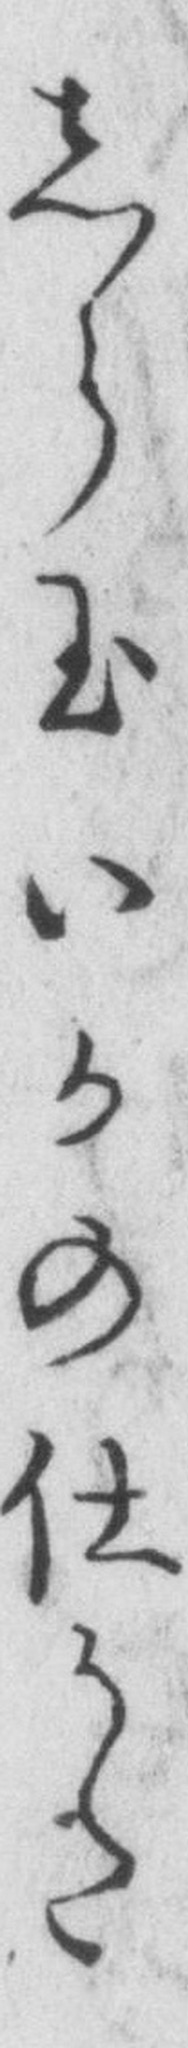しら玉いかの仕かた
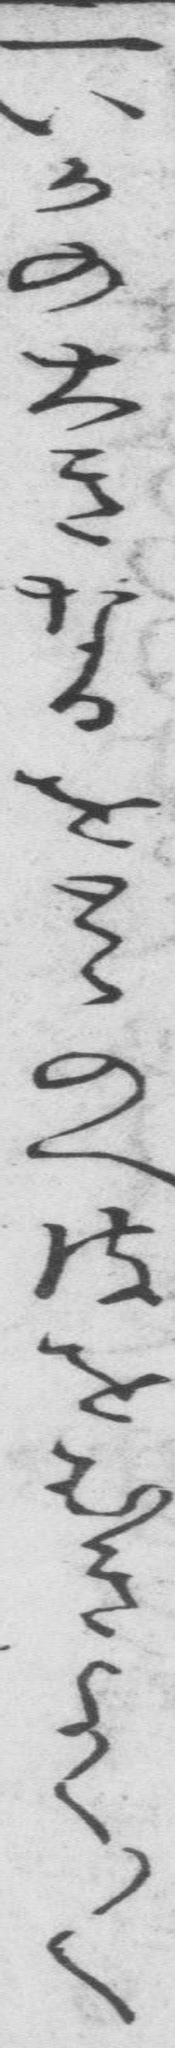一いかの大きなるをとゝのへ。皮をむきよく〳〵
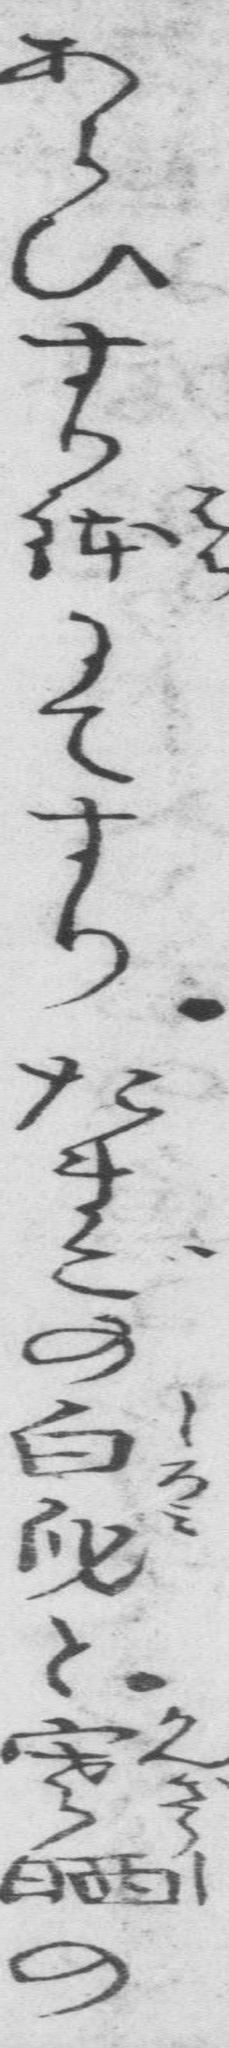あらひすり鉢にてすり。たまごの白身と。寒晒の
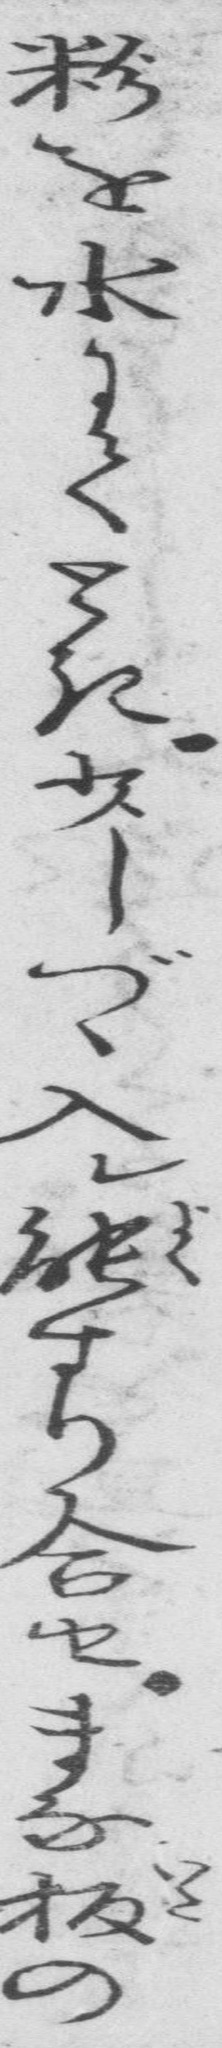粉を水にてとき。少しづゝ入れ能すり合せ。まな板の
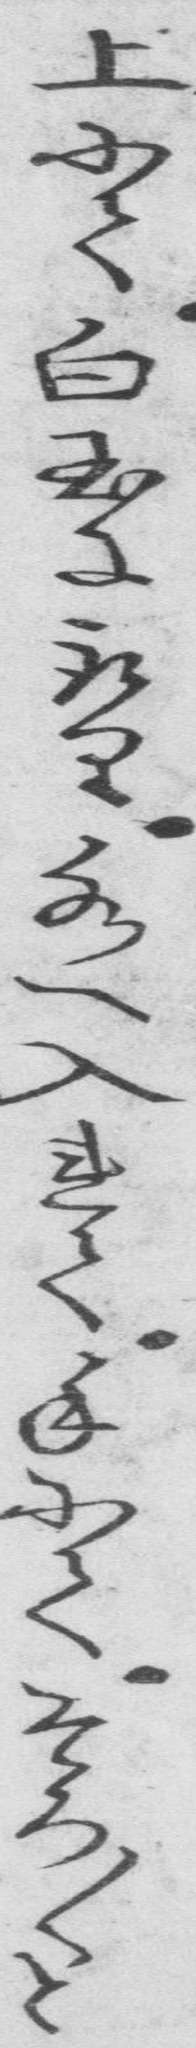上にて。白玉に取り。水へ入れて。手にて。そろ〳〵と
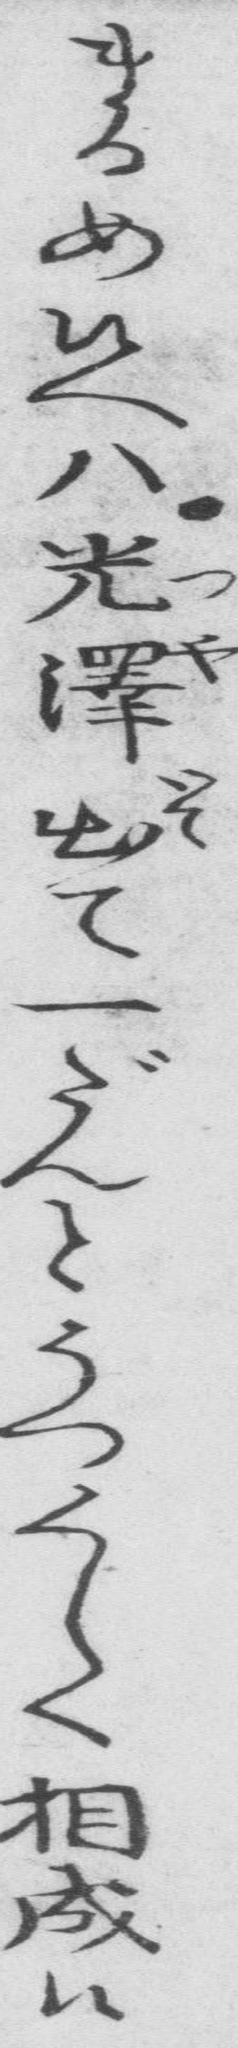まるめ候へは。光沢出て一だんとうつくしく相成候
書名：萬寳料理秘密箱
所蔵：大阪府立大学学術情報センター 国文学研究資料館
